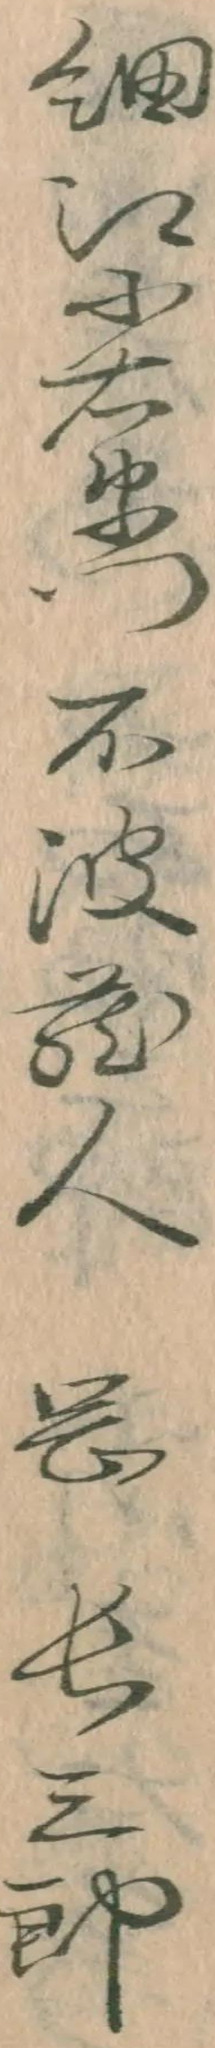細江小右衛門不波落人岡長三郎
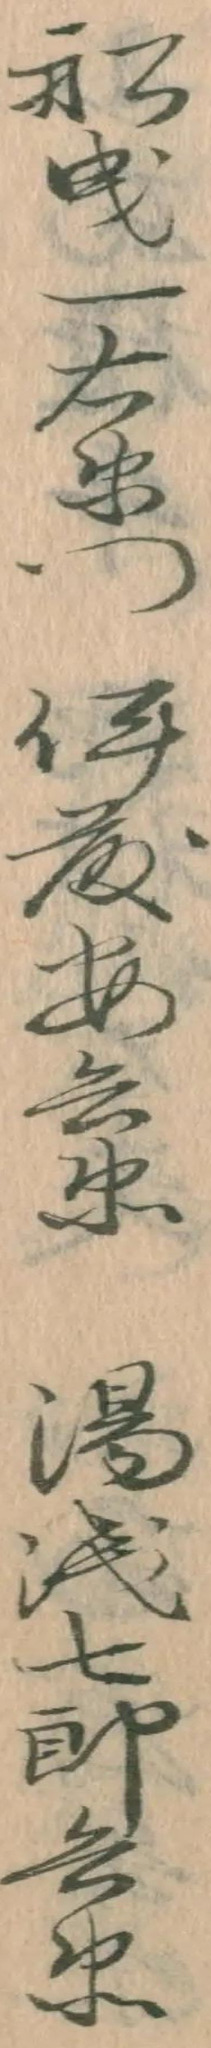舩曳一右衛門伊藤安兵衛湯浅七郎兵衛
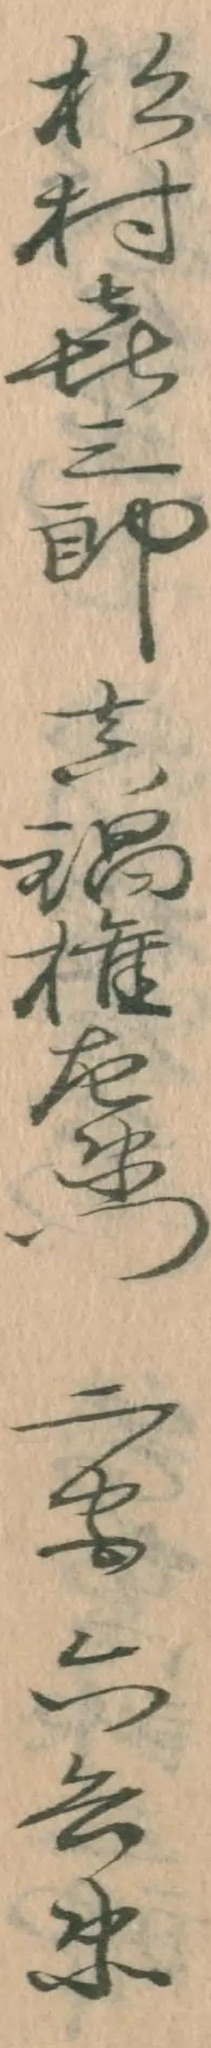杉村喜三郎真鍋権左衛門二宮六兵衛
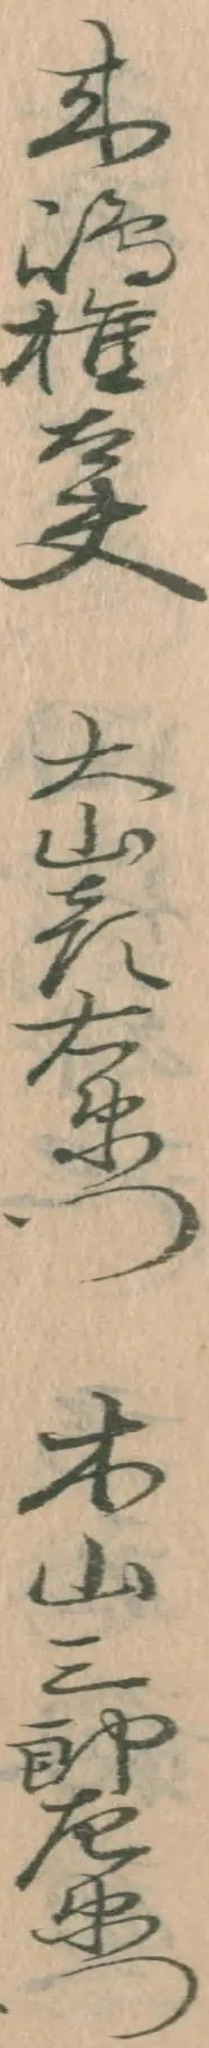来島権太夫大山彦右衛門木山三郎左衛門
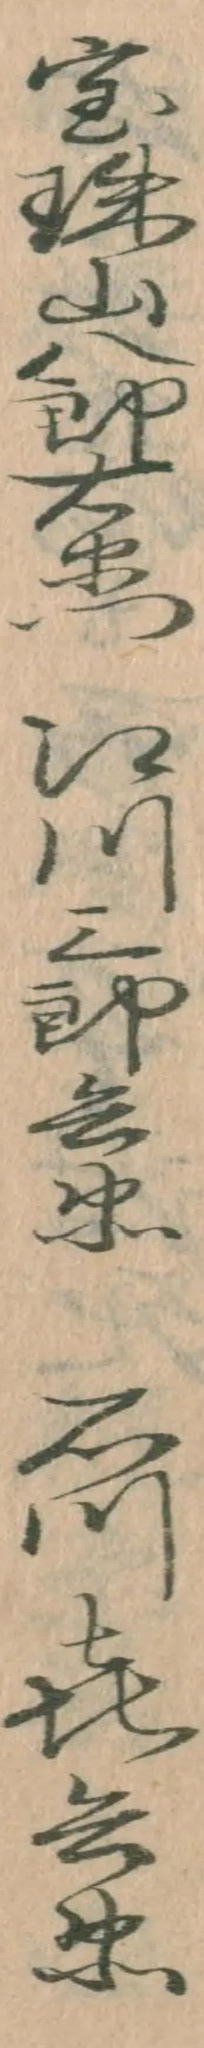宝珠山八郎右衛門江川三郎兵衛石川喜兵衛
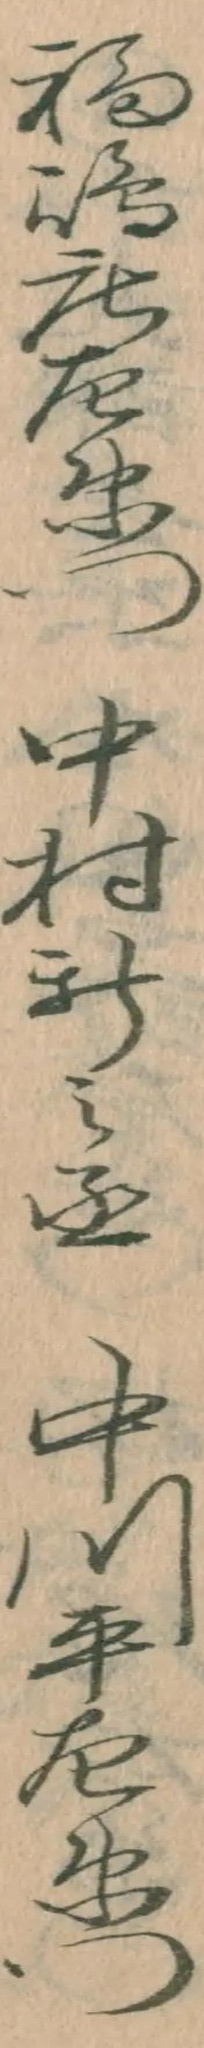福島庄左衛門中村新之丞中川平左衛門
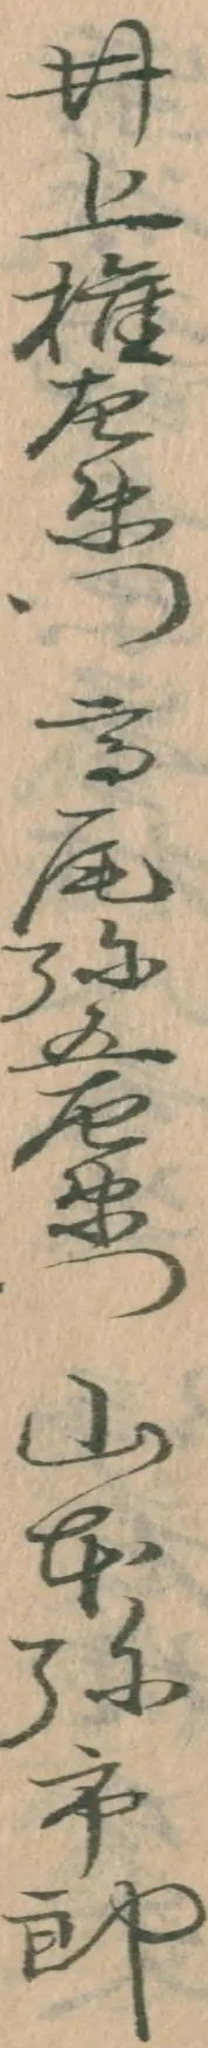井上権左衛門高尾弥五左衛門山本弥市郎
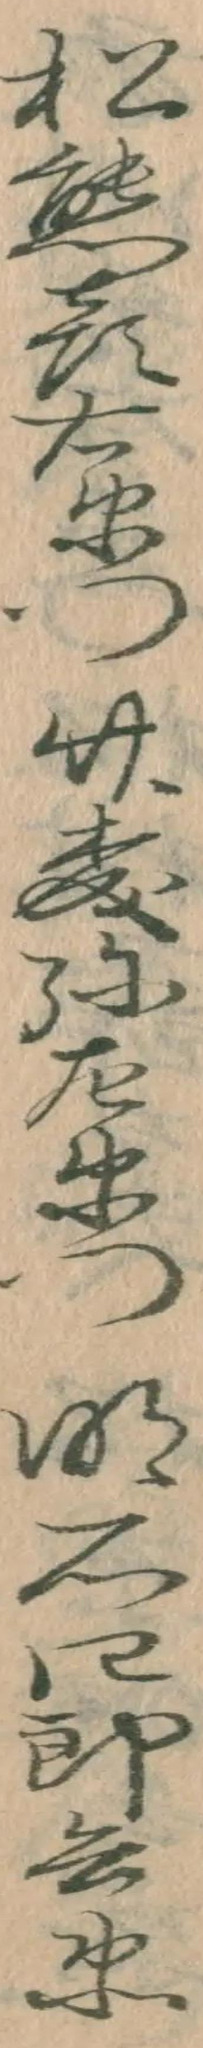松熊記右衛門竹森弥左衛門明石四郎兵衛
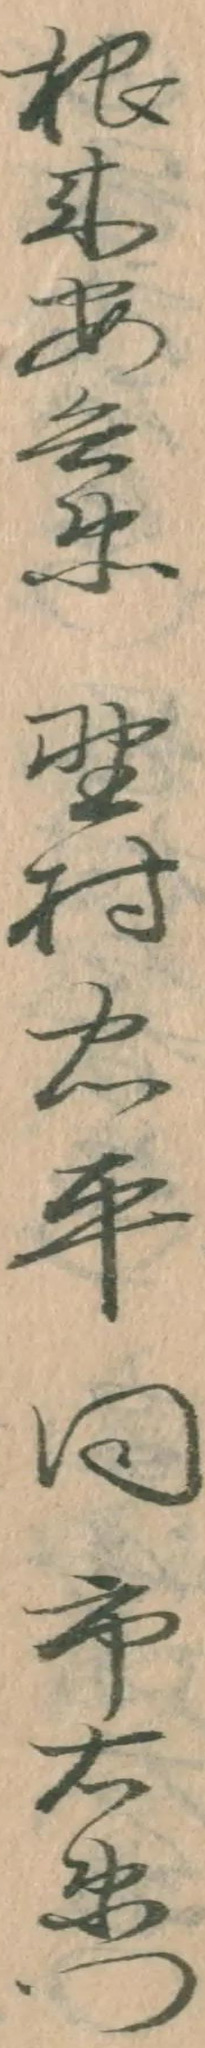根来安兵衛野村忠平同市右衛門
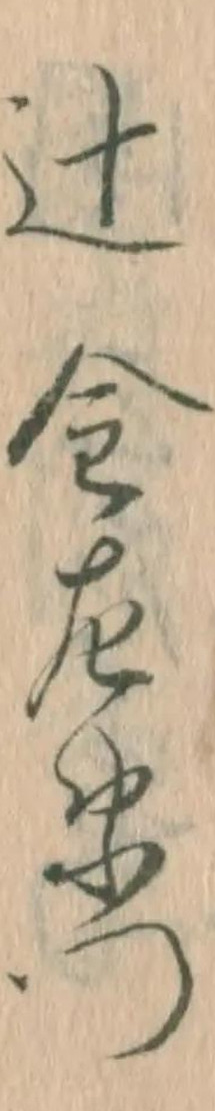辻金左衛門
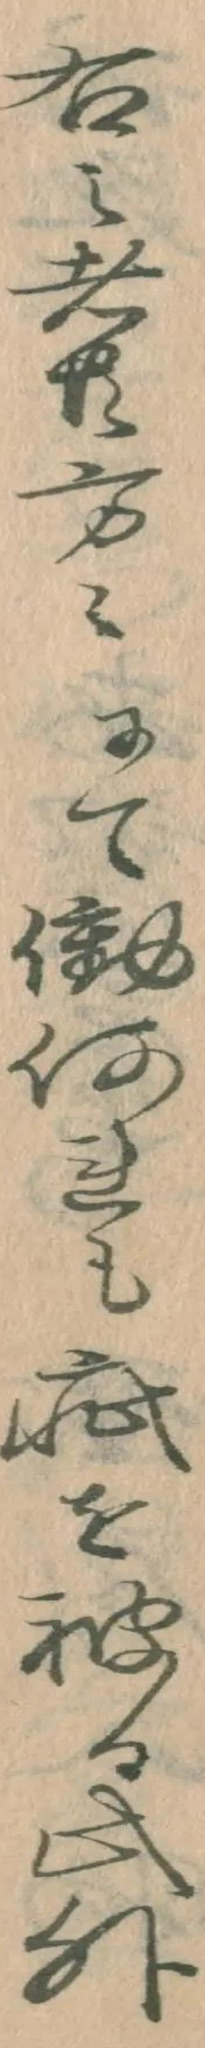右之者共方々尓て働何連も疵を被る此外
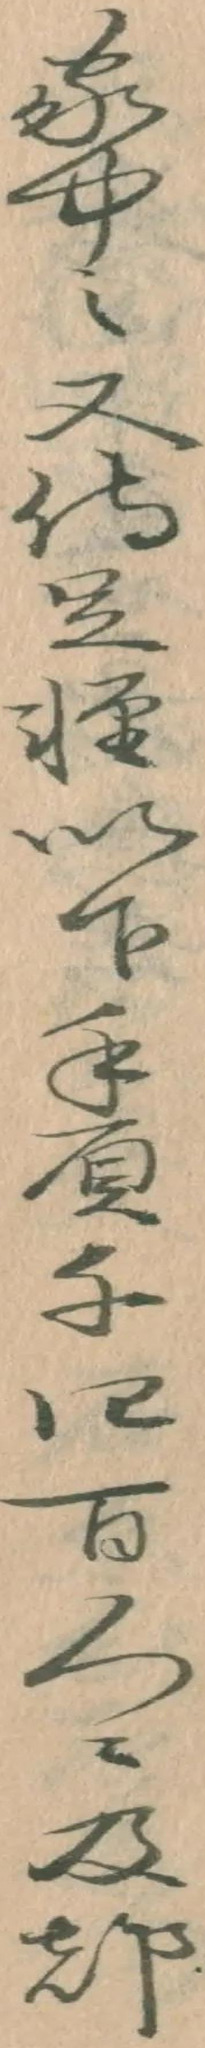家中之又侍足軽以下手負千四百人に及都
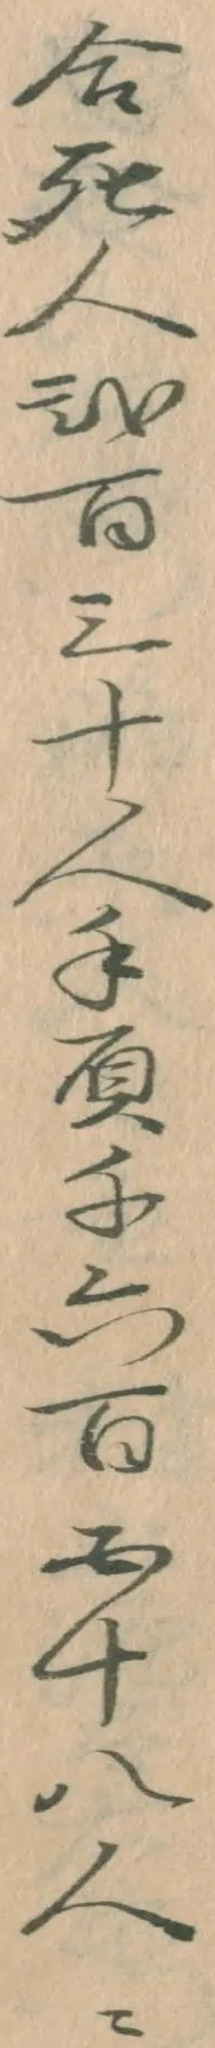合死人弐百三十人手負千六百五十八人に

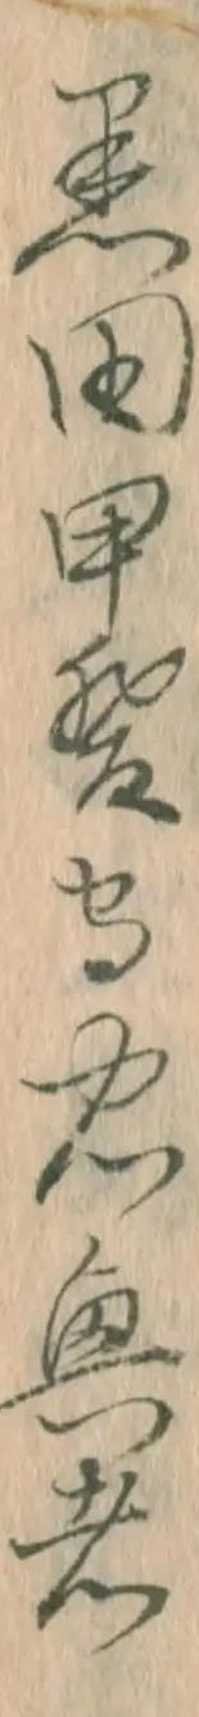黒田甲斐守忠興者
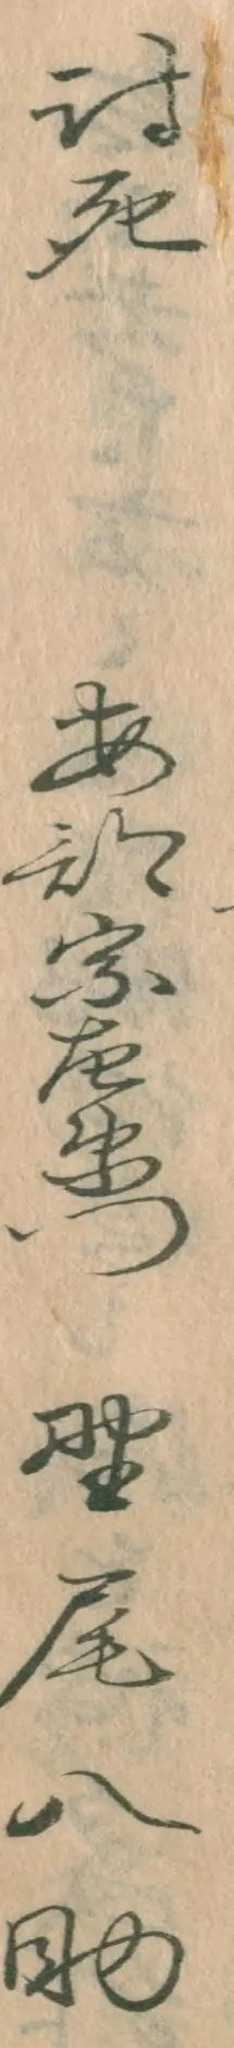討死阿部宗左衛門野尾八助
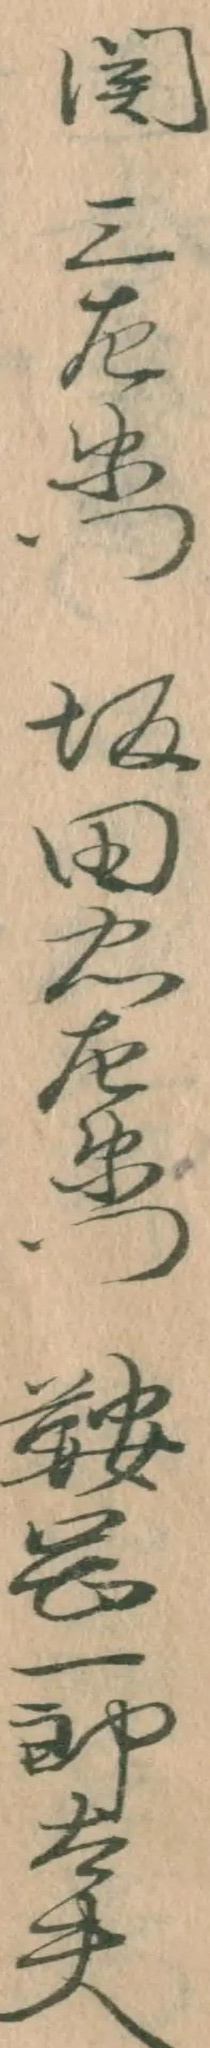関三左衛門坂田忠左衛門鞍岡市郎太夫
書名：切支丹御退治記 49巻. [9]
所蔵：国立国会図書館 National Diet Library, JAPAN
